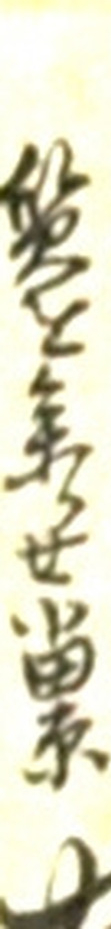質を参らせ小田原
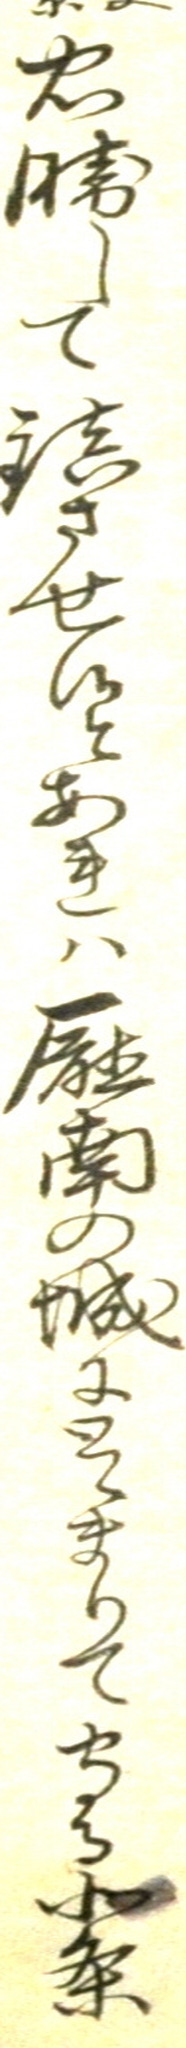忠勝して鎮させ候とあれは庁南の城にとゝまりて守る北条
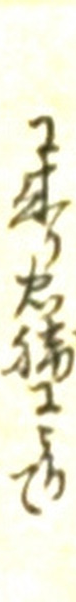に来り忠勝によりて
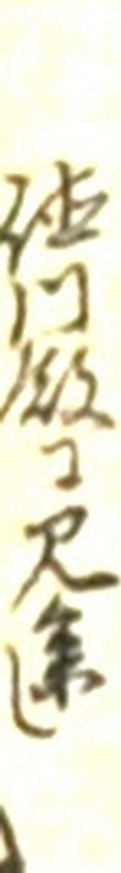徳川殿に見参し
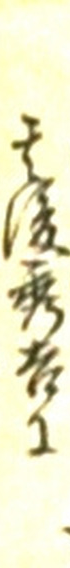其後秀吉に
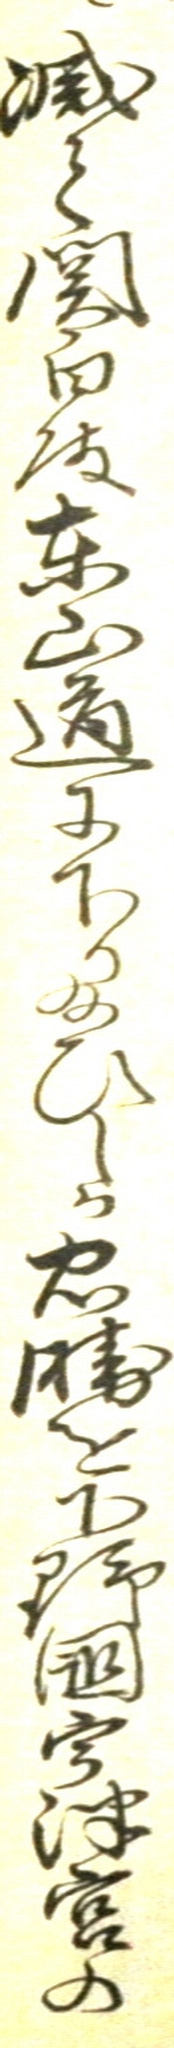滅て関白殿東山道に下り給ひしか忠勝を下野国宇津宮の
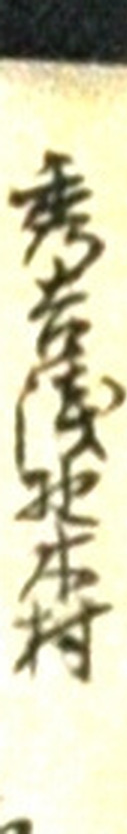秀吉浅野木村
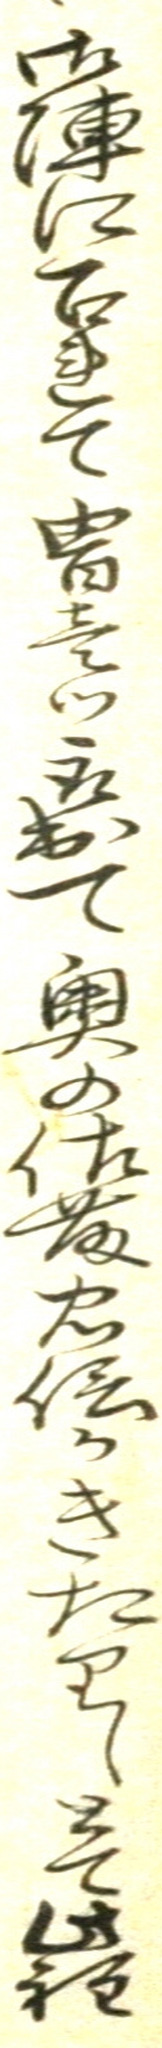御陣に召れて冑壱ツ取出て奥の佐藤忠信かきたりしとて此程
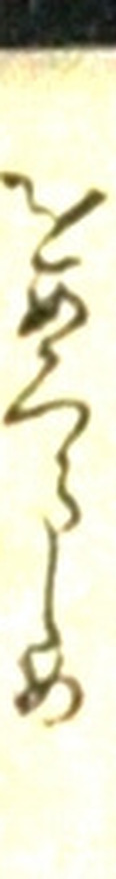をめくらしめ
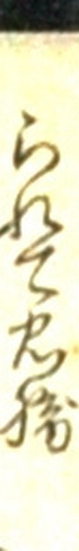られて忠勝
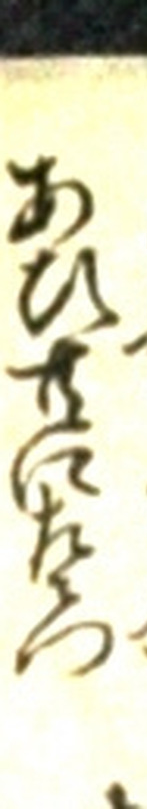あひ共に左ヱ門
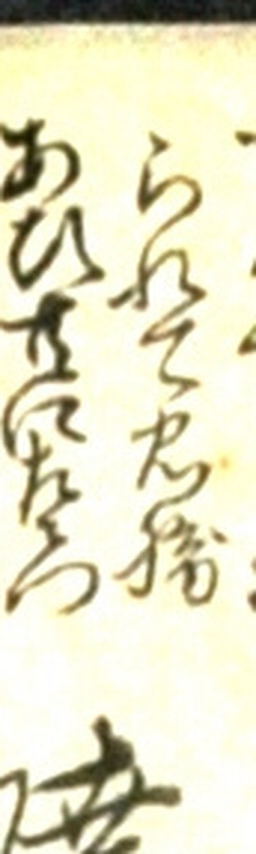あひ共に左ヱ門
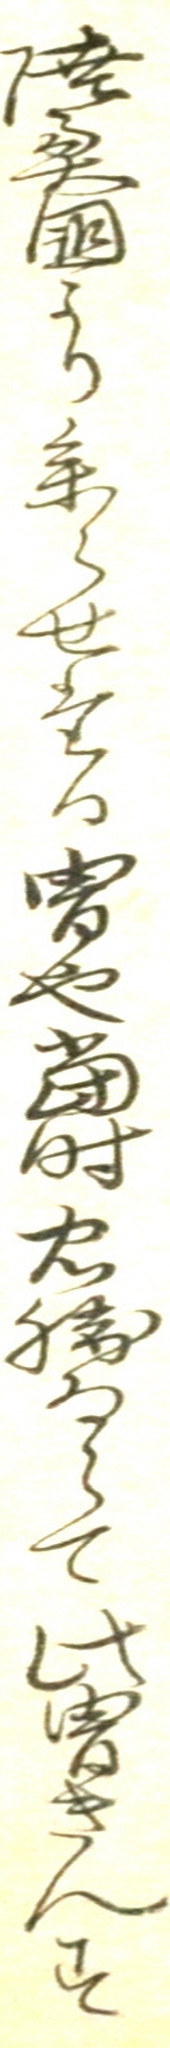陸奥国より参らせたる冑也当時忠勝ならて此冑きんす
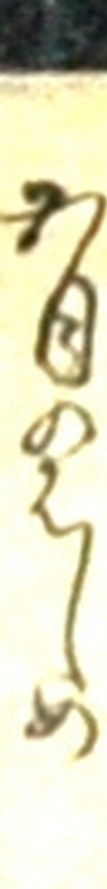五月のはしめ
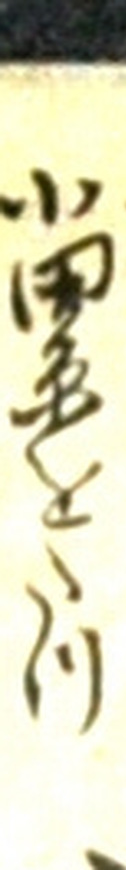小田原をたつ
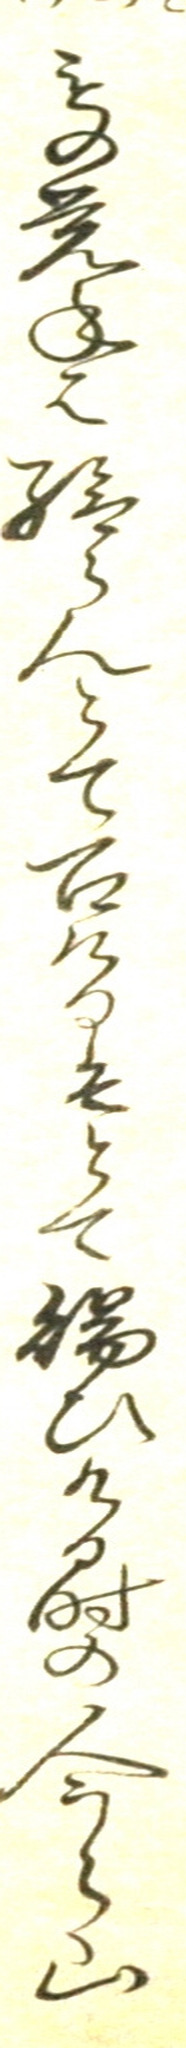もの覚ねは給らんとて召けるそとて賜ひける時の人うら山
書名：藩翰譜（四・上）
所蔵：伊那市立高遠町図書館・合同会社AMANE
